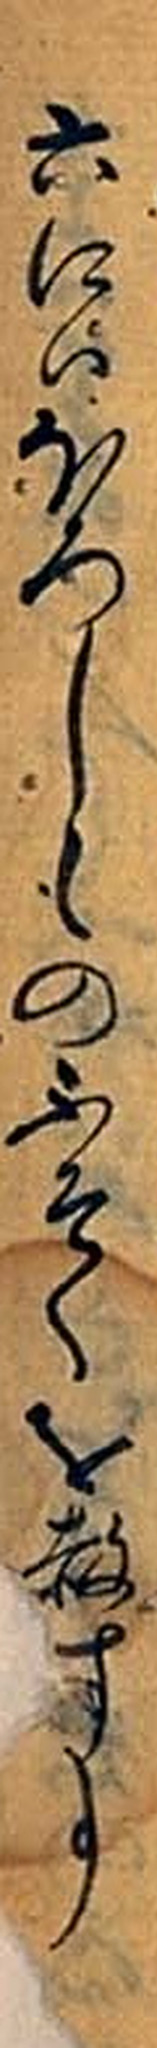六にはほろしものふそくを赦す事

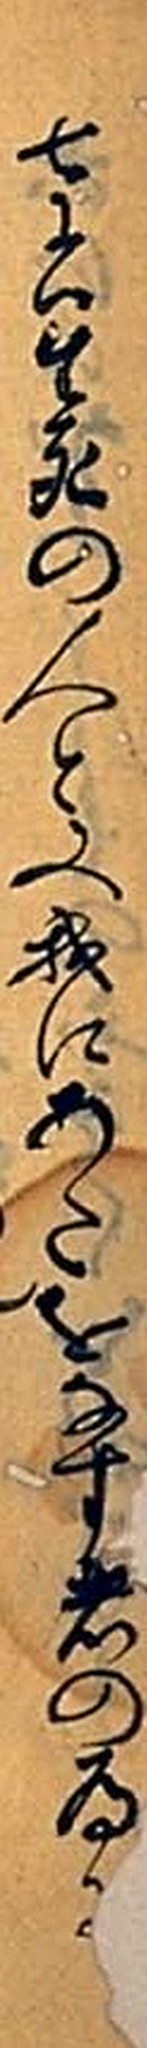七には生死の人と又我にあたをなす者の為に
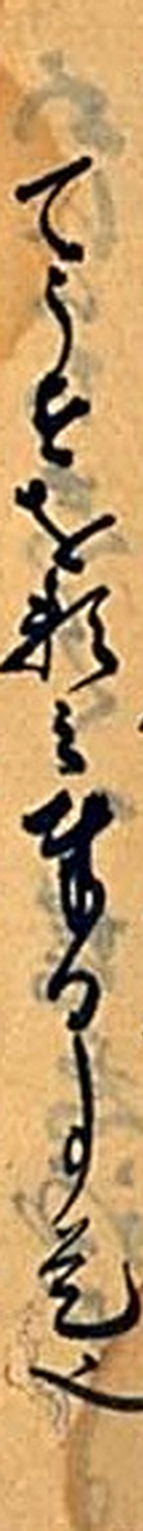てうすを頼み奉る事是也
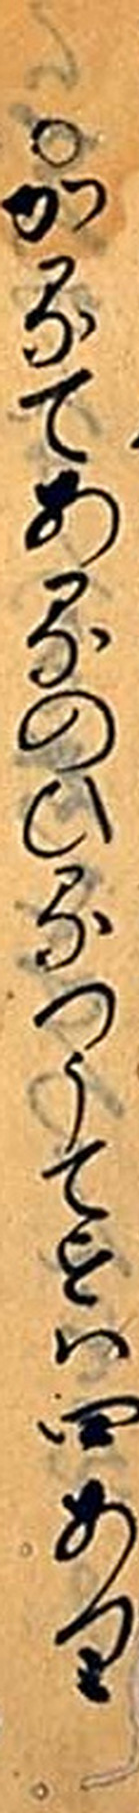○かるてあるのひるつうてすは四あり
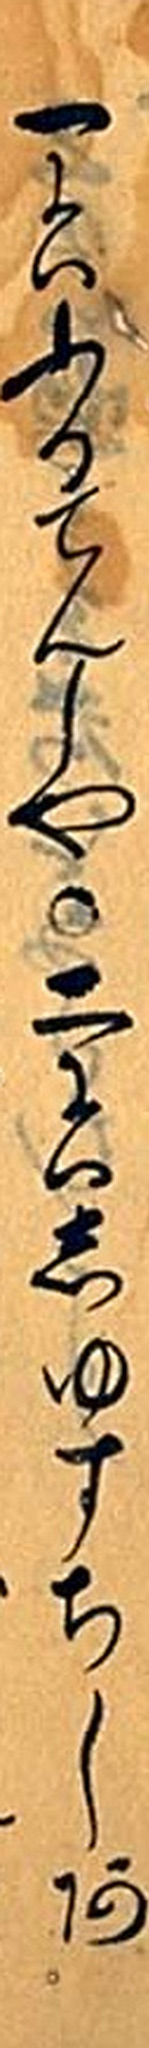一にはふるてんしや○二にはしゆすちしあ
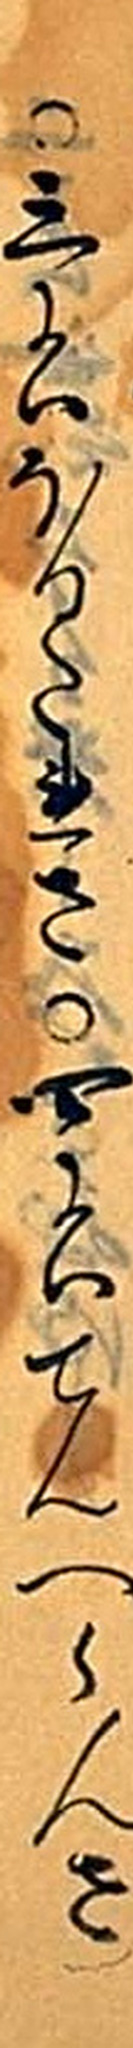○三にはほるたれさ○四にはてんへらんさ
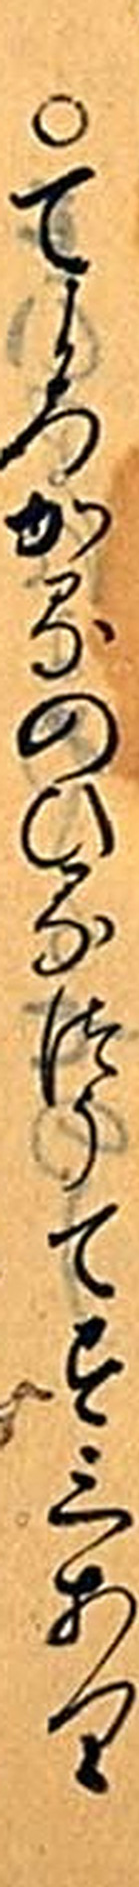○てよろかるのひるつうてす三あり
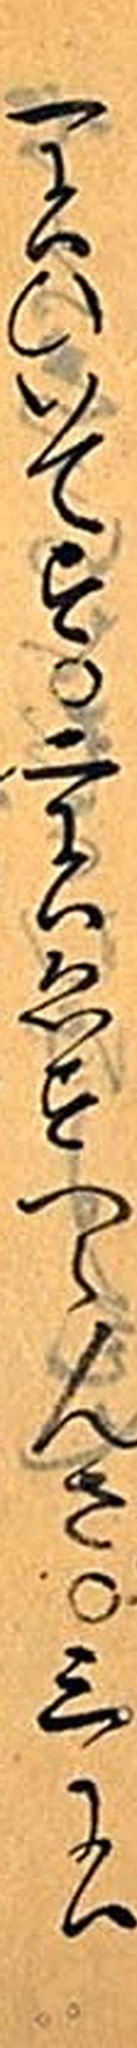一にはひいてす○二にはゑすへらんさ○三には
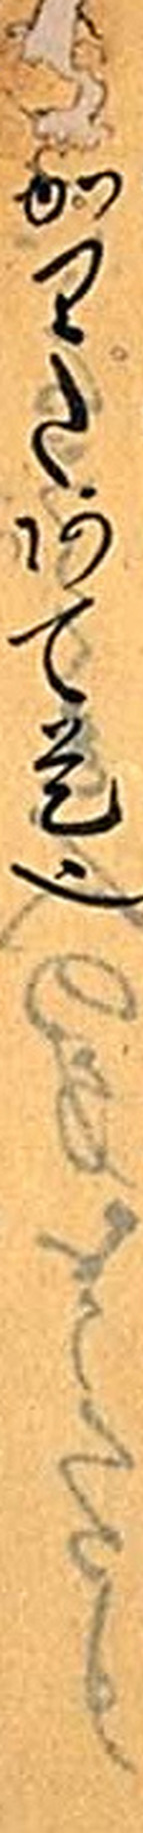かりたあて是也
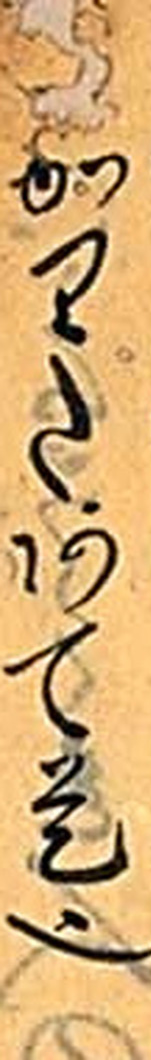かりたあて是也
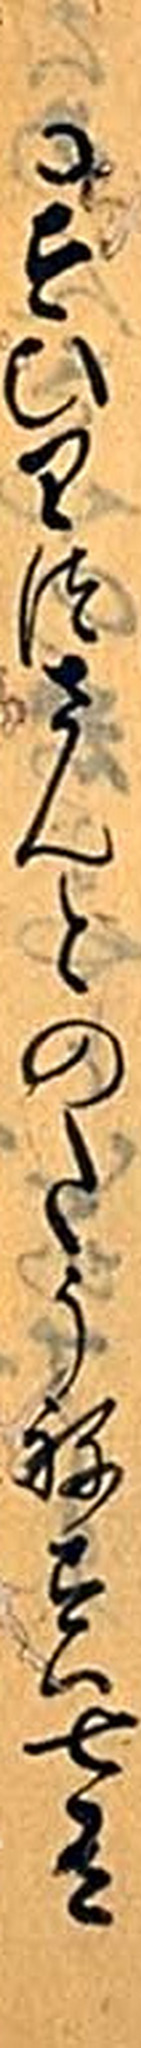○すひりつさんとのたうねすは七有
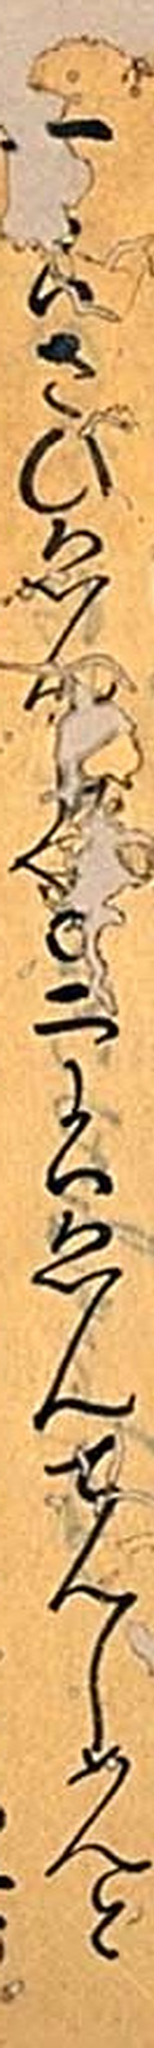一にはさひゑん○二にはゑんてんしめんと
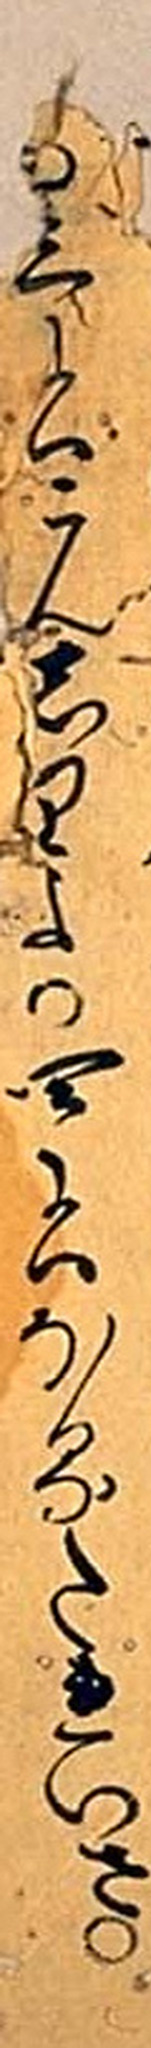三にはこんしりよ○四にはほるたれいさ○
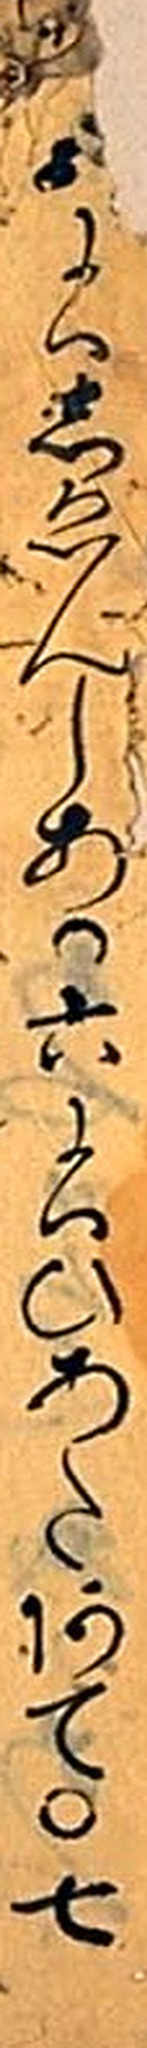五にはしゑんしあ○六にはひあたあて○七
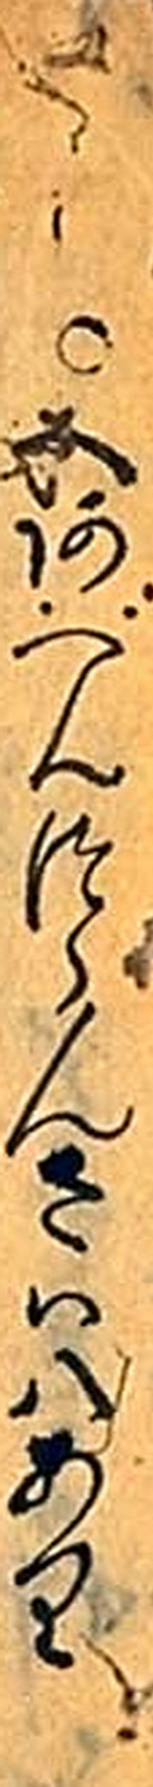○へあべんつらんさは八あり
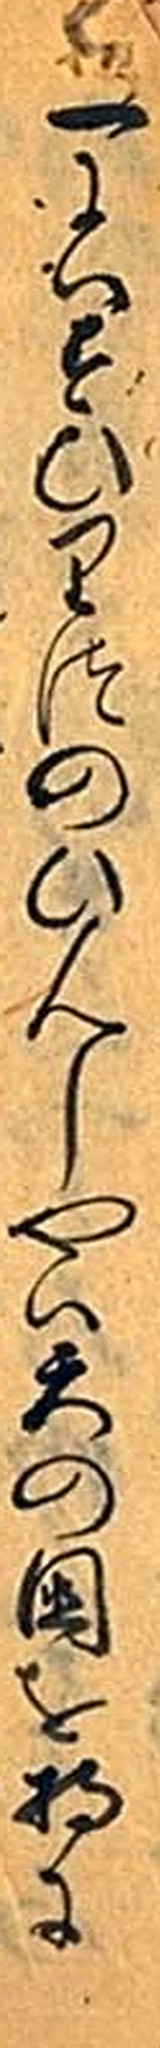一にはすひりつのひんしやは天の国を持に
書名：ドチリナ・キリシタン
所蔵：東京大学総合図書館 / General Library in the University of Tokyo
